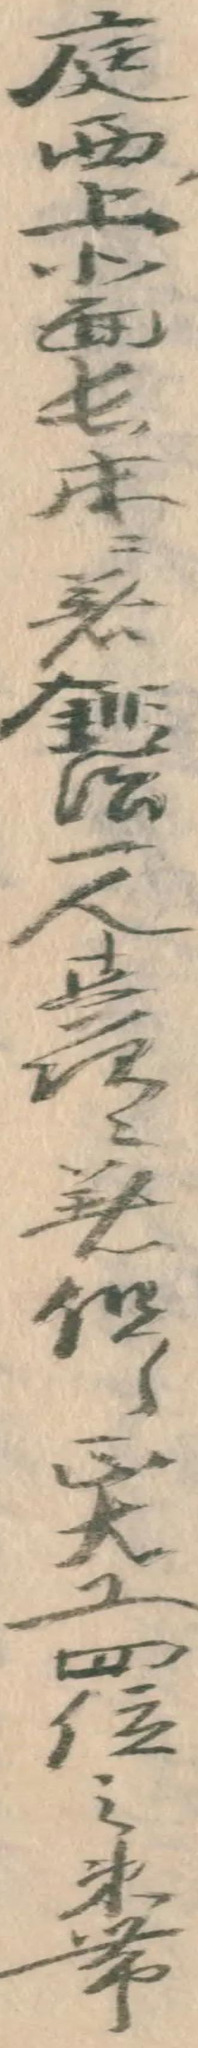庭西上北面長床ニ着鍛冶一人其次ニ着但し正大工四位之束帯
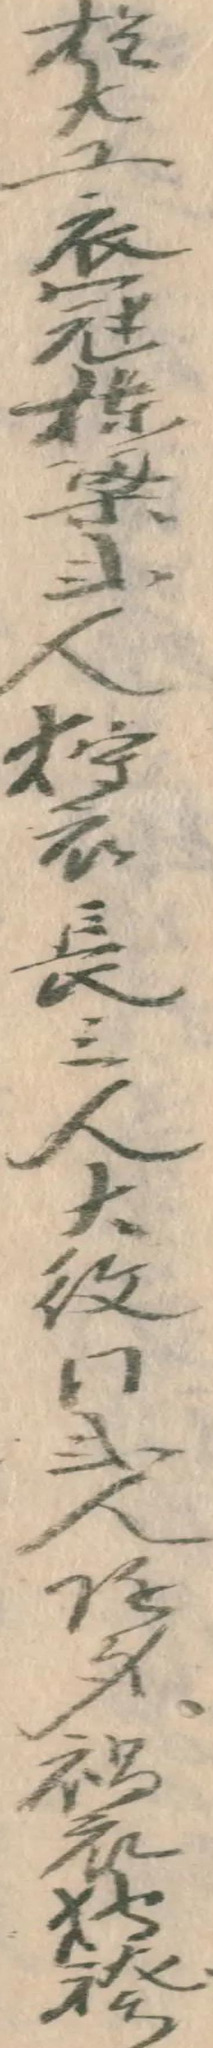権大工衣冠権棟梁弐人狩衣長三人大紋同弐人随身褐衣狩袴
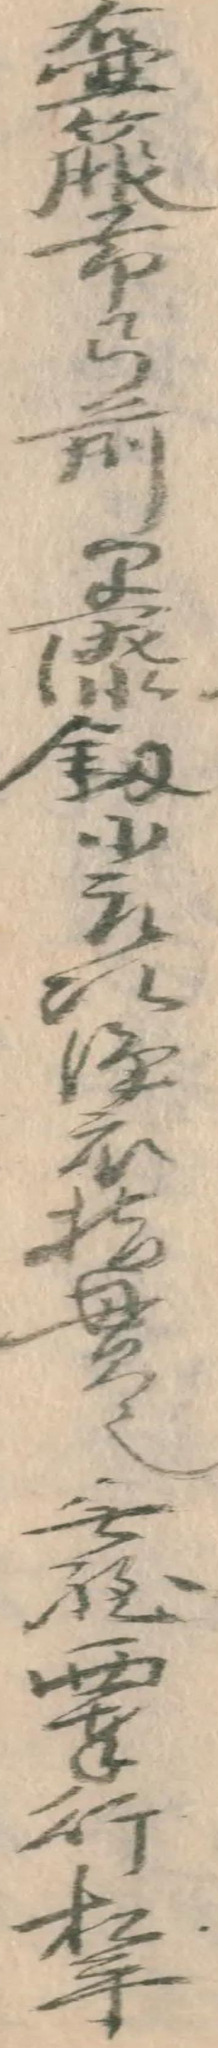壺箙帯弓前黒漆劔小取次浄衣指貫也無程西奉行松平
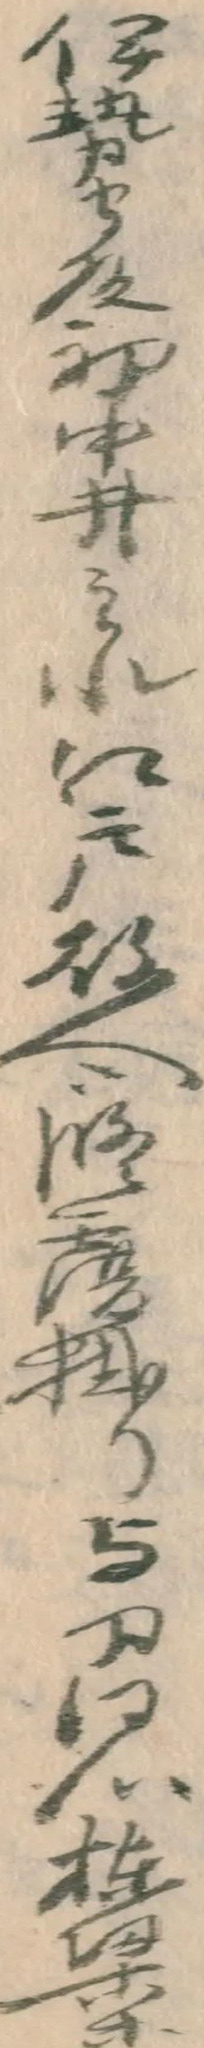伊勢守殿初中井主水江戸役人御修覆掛り与力同心棟梁等
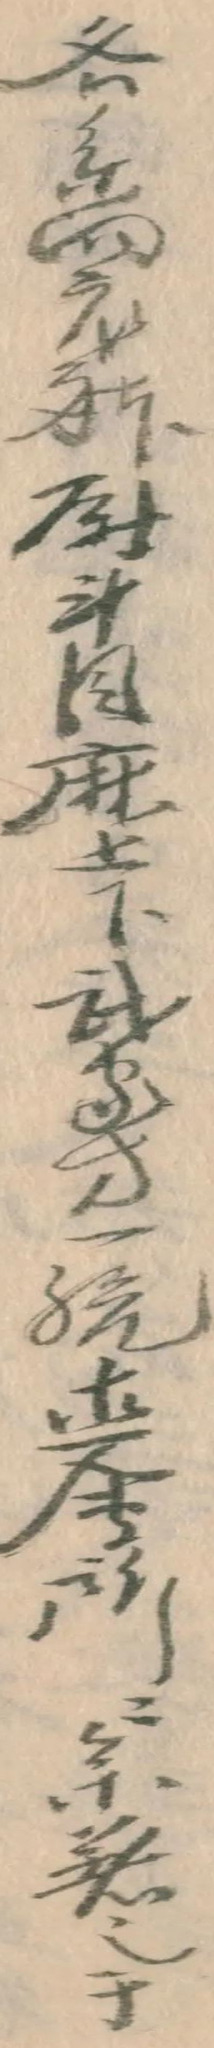各参向衣躰尉斗目麻上下武家方一統直會所に参着也于
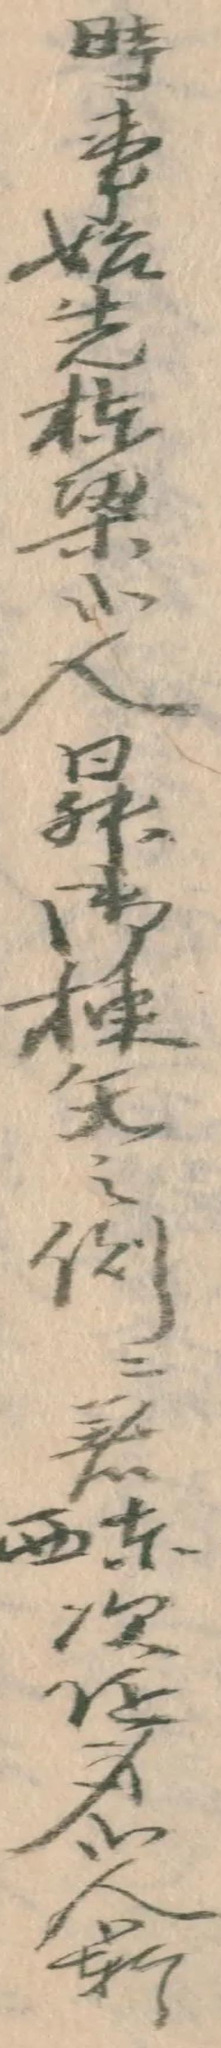時事始先棟梁弐人昇御棟矢之側に着東面次随身弐人御軒
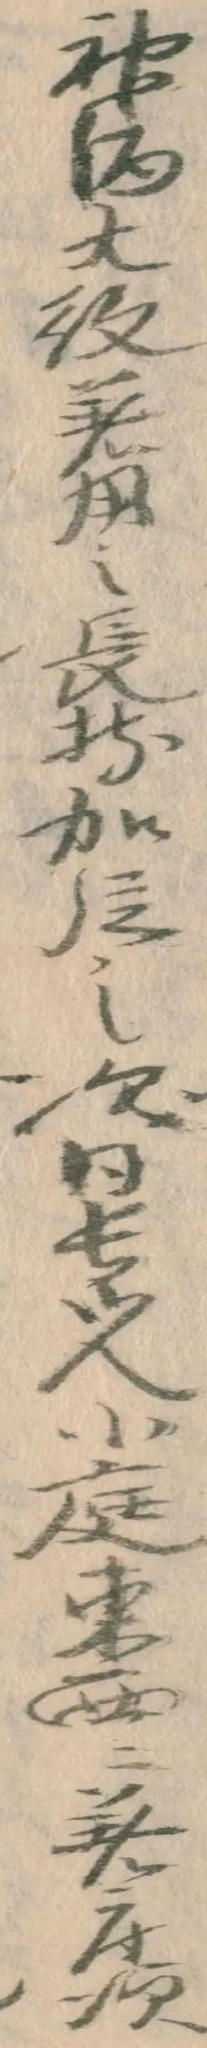神酒大紋着用之長持加従之次同長弐人小庭東西ニ着座次
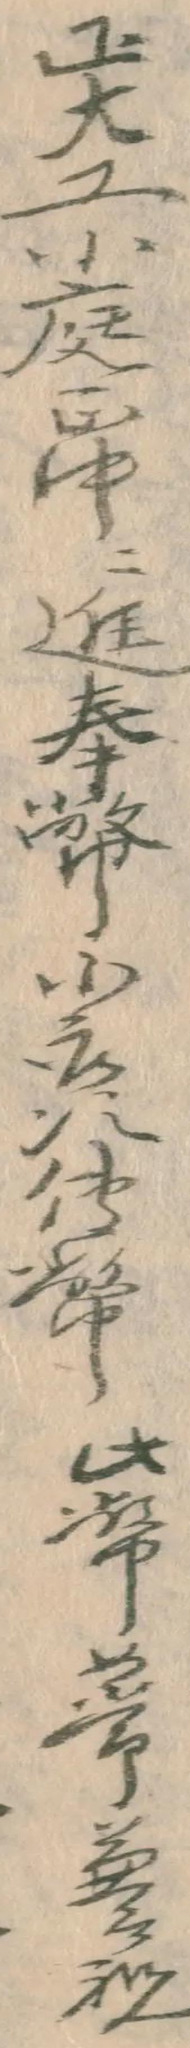正大工小庭正中ニ進奉幣小取次傳幣此幣如常兼而祝
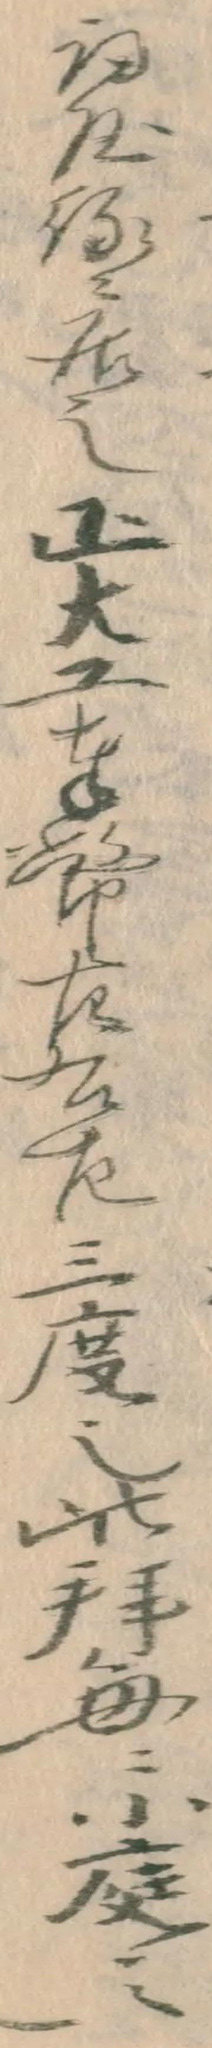詞屋縁ニ居之正大工奉幣左右左三度之此拝毎ニ小庭之
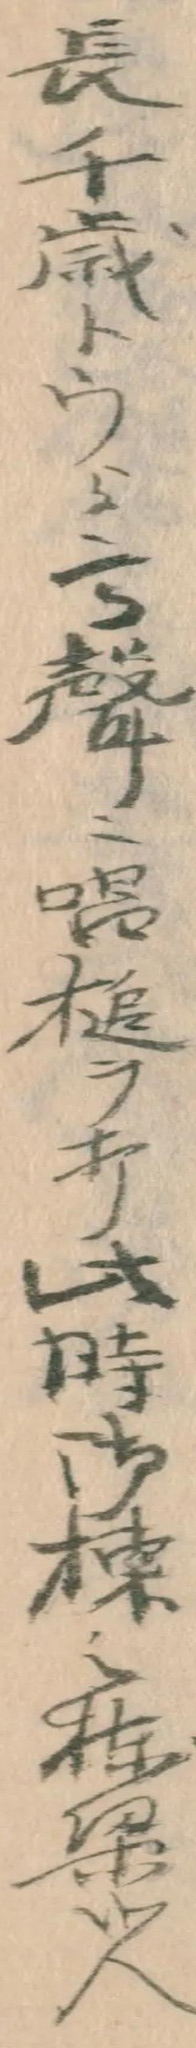長千歳トウと高聲ニ唱槌ヲ打此時御棟之棟梁弐人
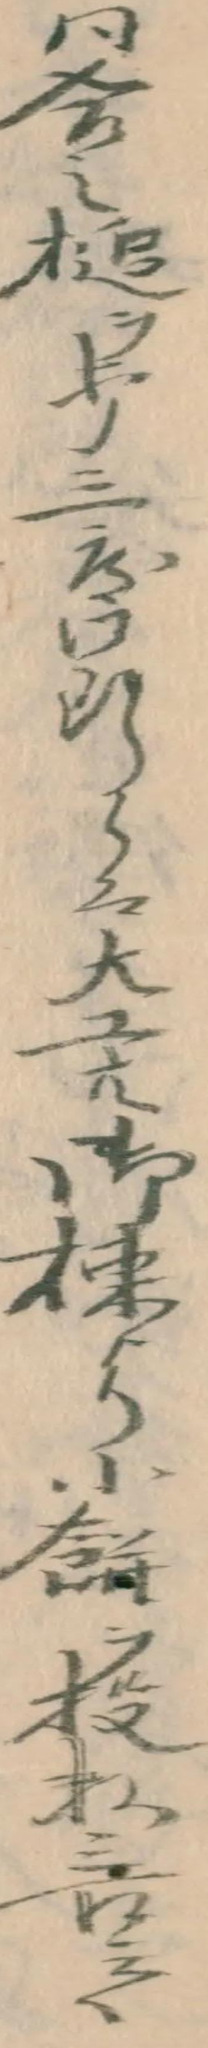同合之槌ヲ打三度同断了而大工共御棟より小餅ヲ投払三百云々
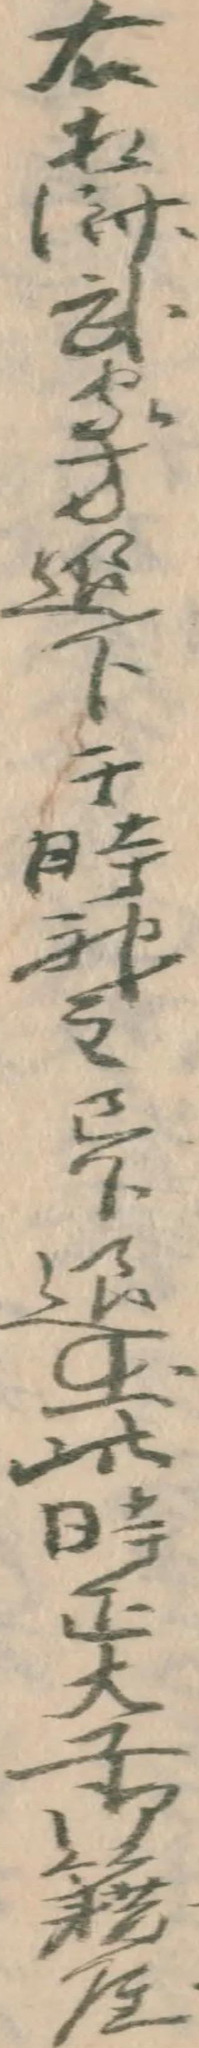右相済武家方退下于時神主已下退出此時正大工御籍屋
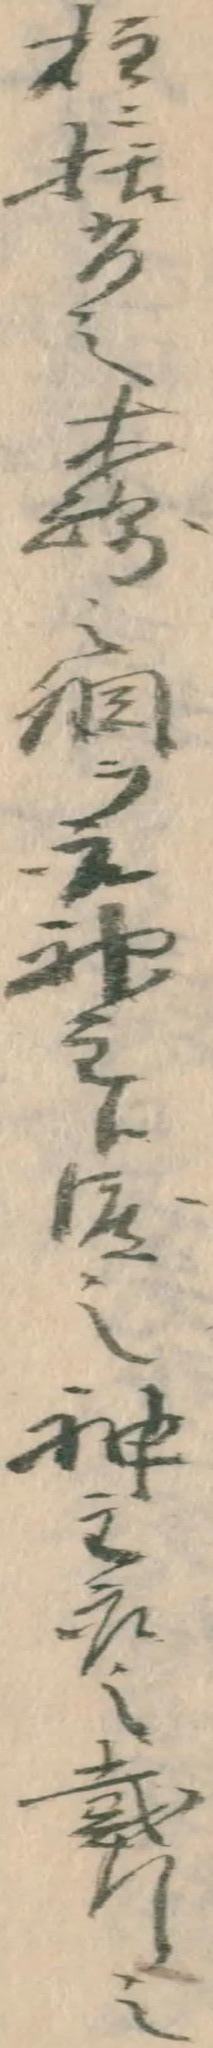柱ニ括有之木綿之網ヲ取神主え渡之神主取之裁断之
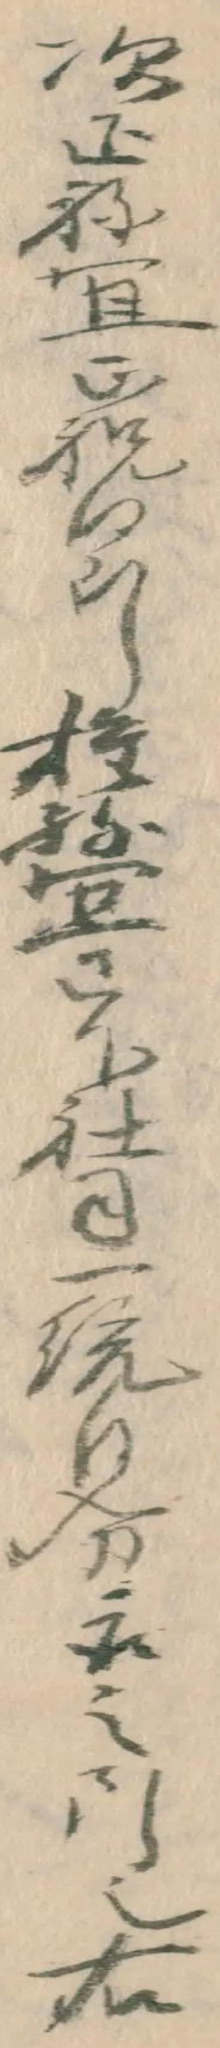次正祢宜正祝同断権祢宜已下社司一統自分取之引也右
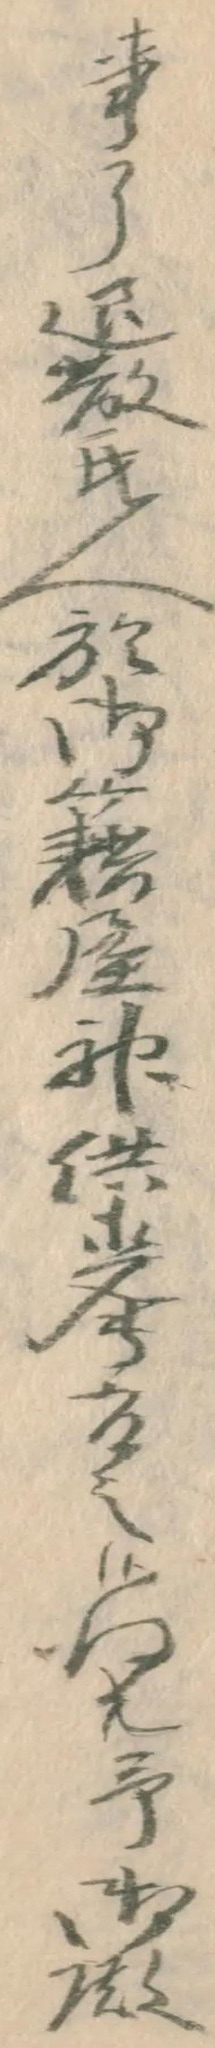事了退散氏人於御籍屋神供直會有之候得共予御殿
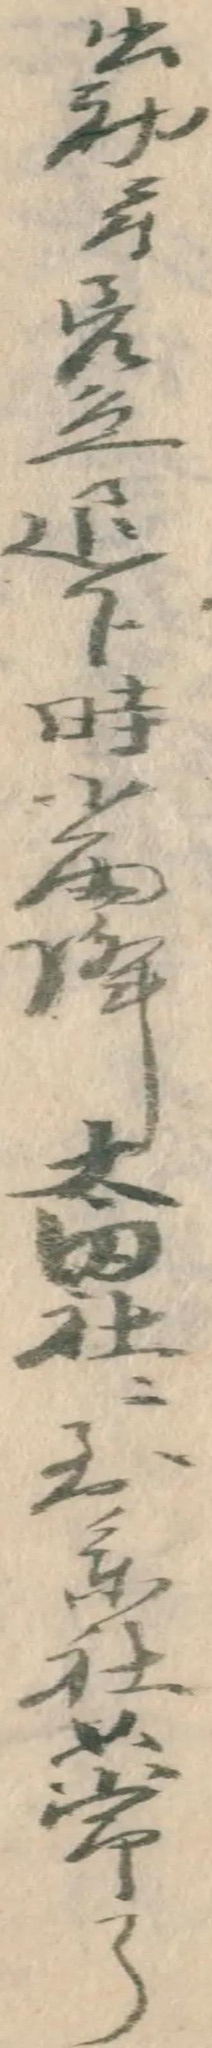出勤ニ付先立退下時小雨降大田社ニ到参社如常了
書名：賀茂社記録. 第67冊
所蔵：国立国会図書館 National Diet Library, JAPAN
